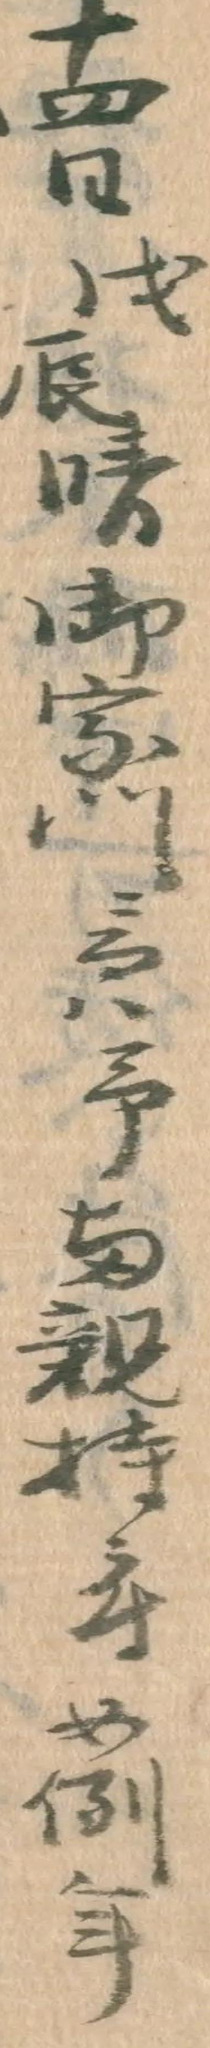十四日戊巳晴、御家門ニ而ハ、予両親持ニ付、如例年
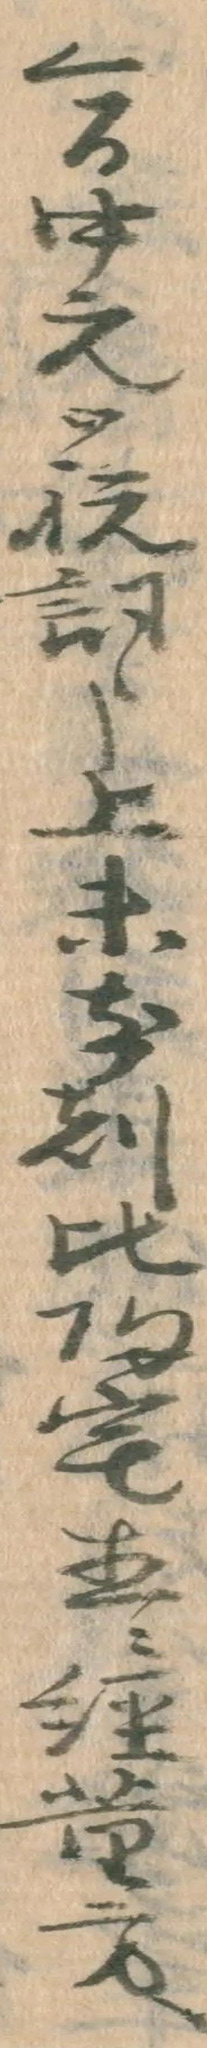今日中元御祝詞之上、未半刻比帰宅、直ニ経董方ヘ
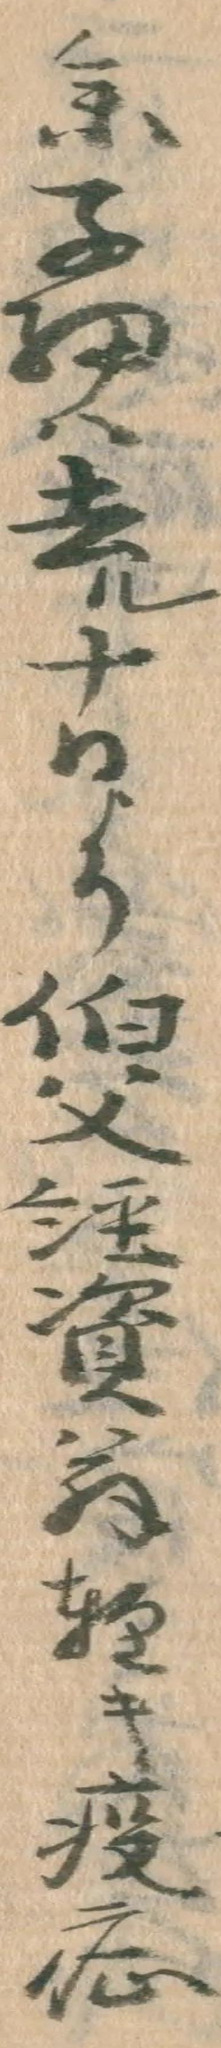参、子細ハ去ル十日より伯父経資翁軽キ疫ニ征
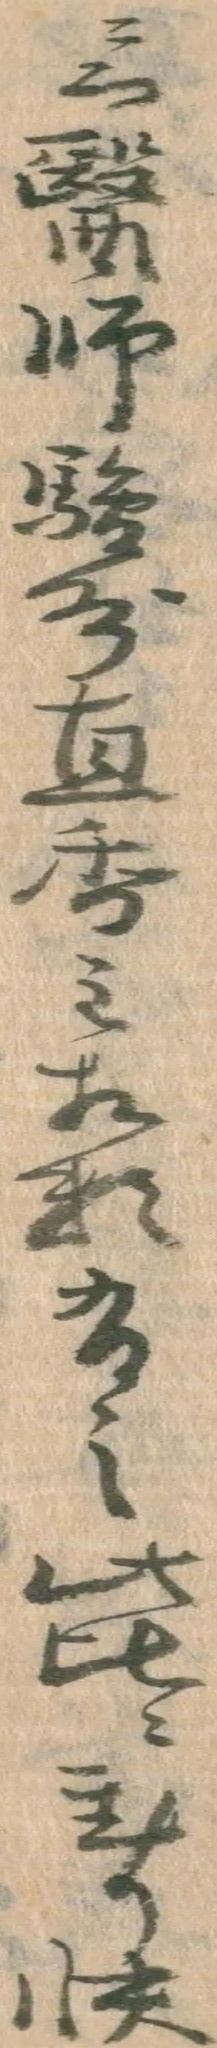ニ而、醫師駿河直秀之相頼有之、此比ニ至り快
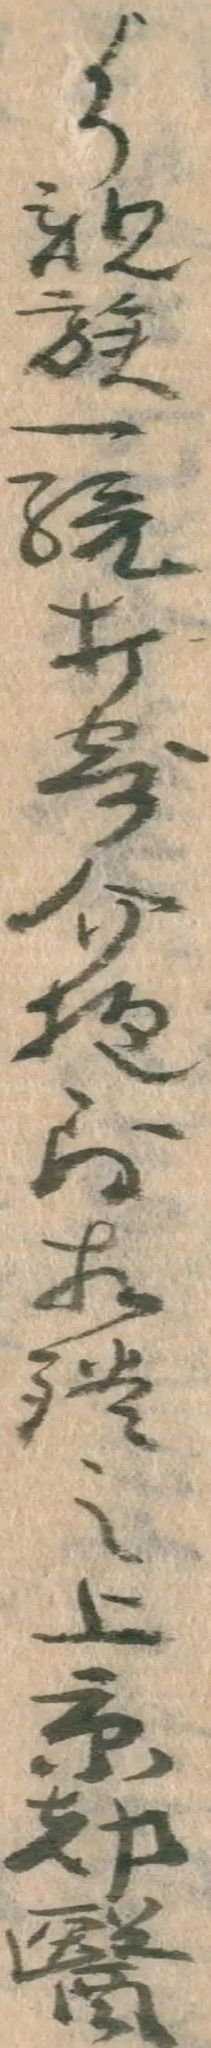より親族一統打寄介抱致、相談之上京、都醫
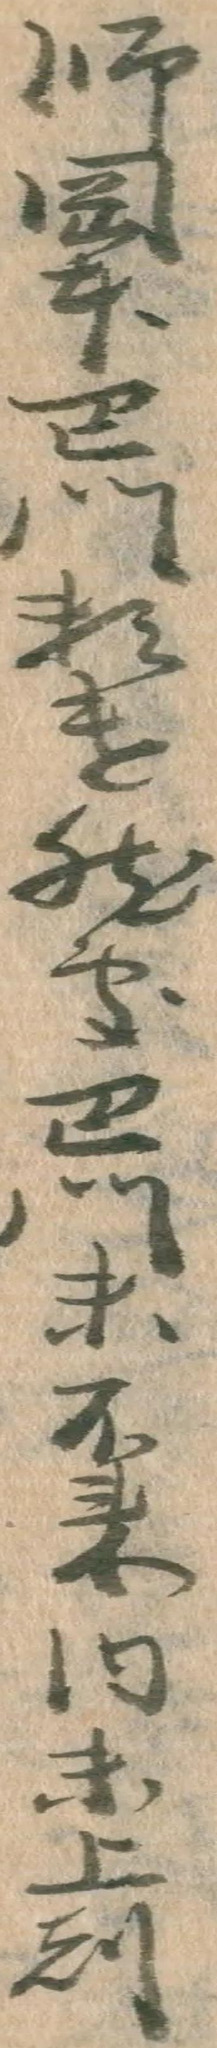師岡本巴門頼遣、然処巴門未不来内、未上刻
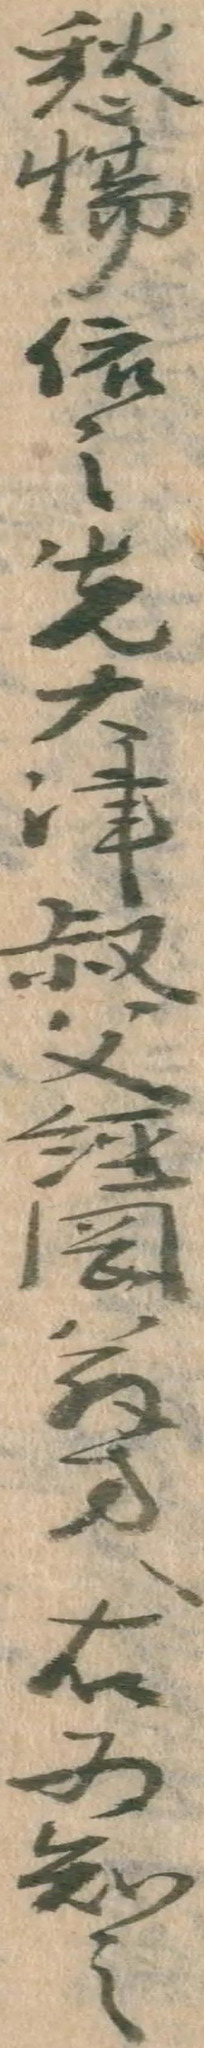愁傷、依之先大津叔父經岡翁方へ、右為知之
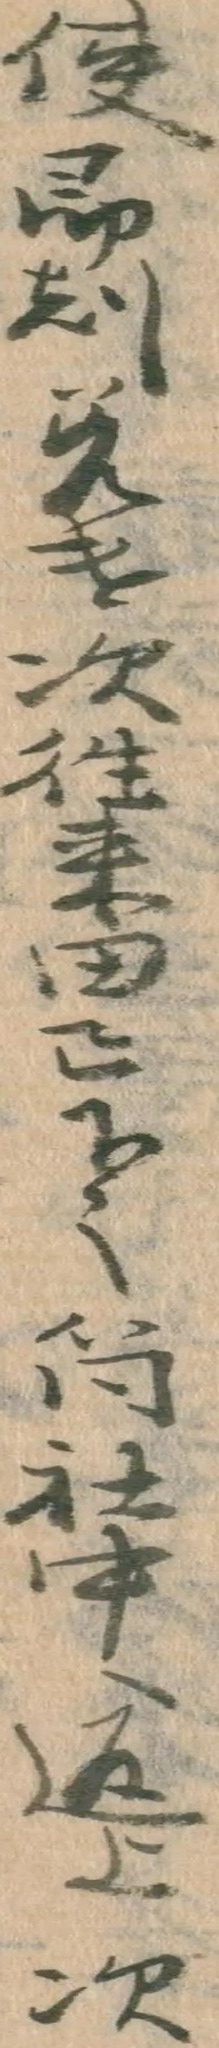使即刻差遣、次往来田已下之筒、社中へ返上、次
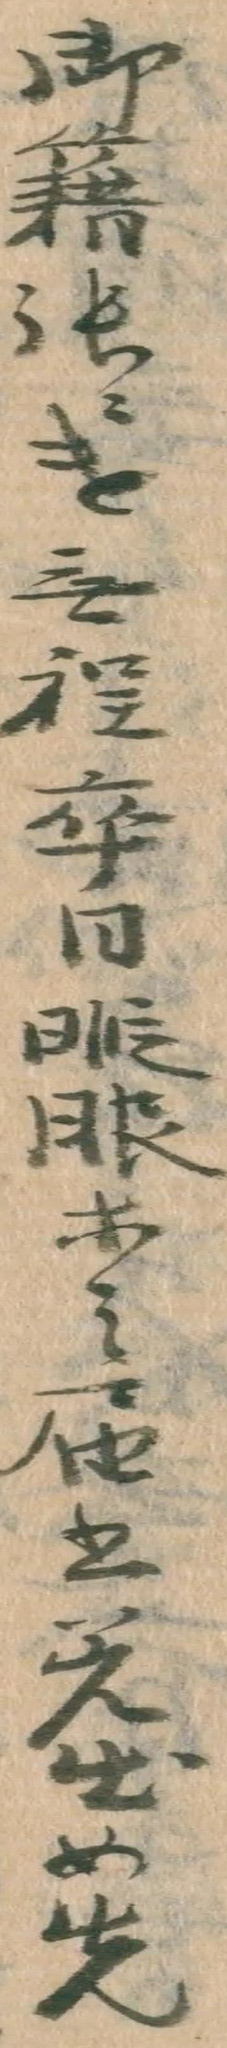御籍張二遣、無程卒日暇服等之届書差出、如先
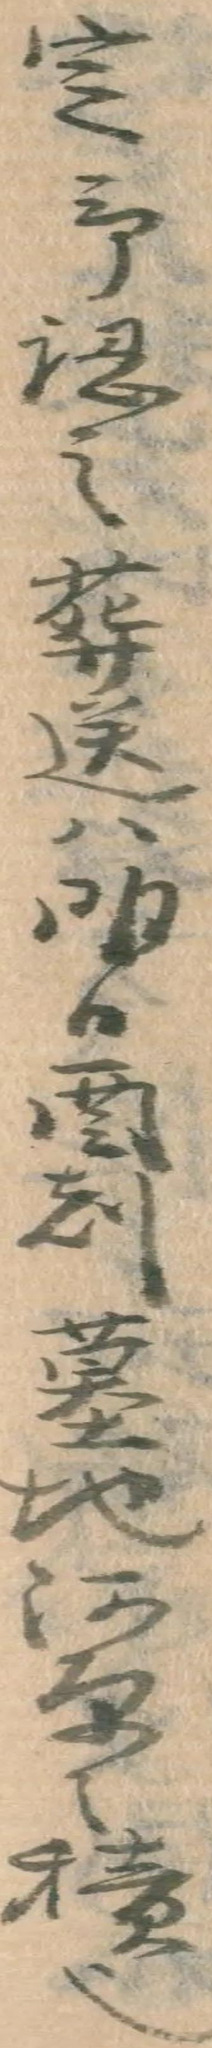定予認之、葬送ハ明日酉刻、墓地河原之積也、
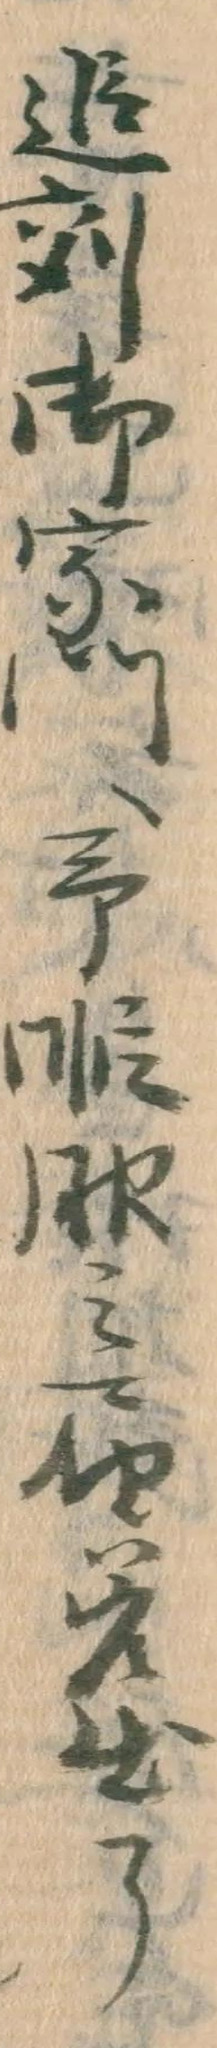追刻御家門へ予暇服之届差出了、
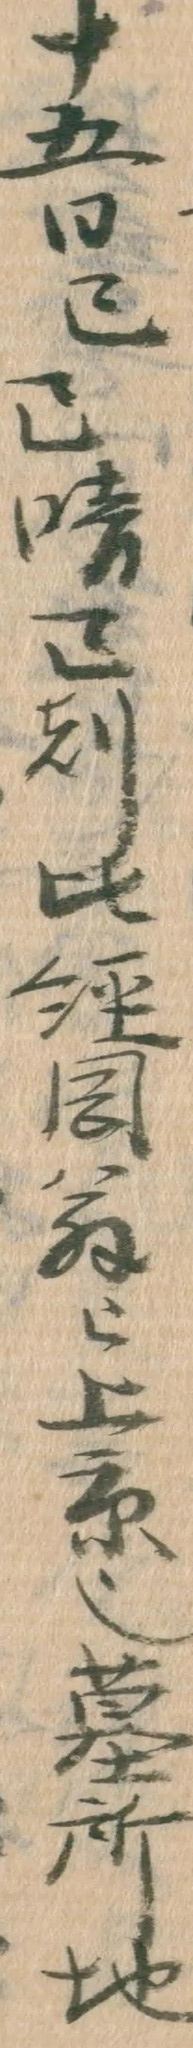十五日己巳晴、巳刻比、経岡翁上京也、墓所地
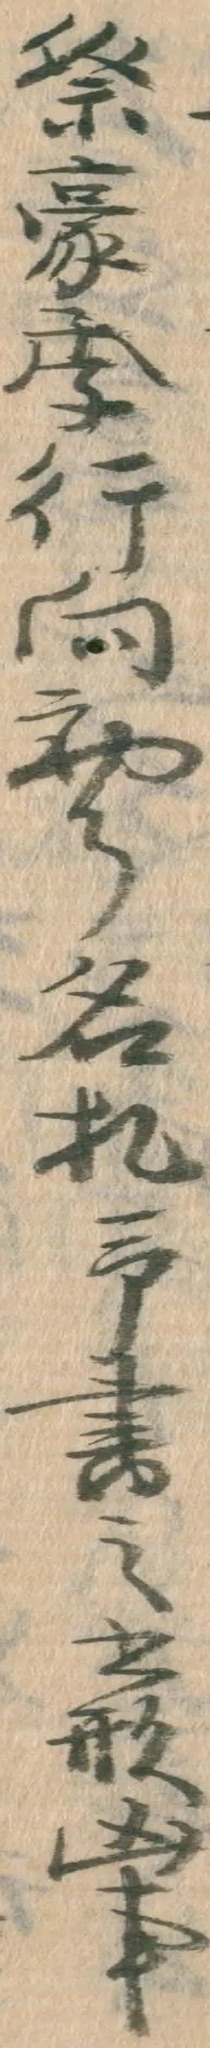祭豪季行向勤了、名札予書之、書形凶事
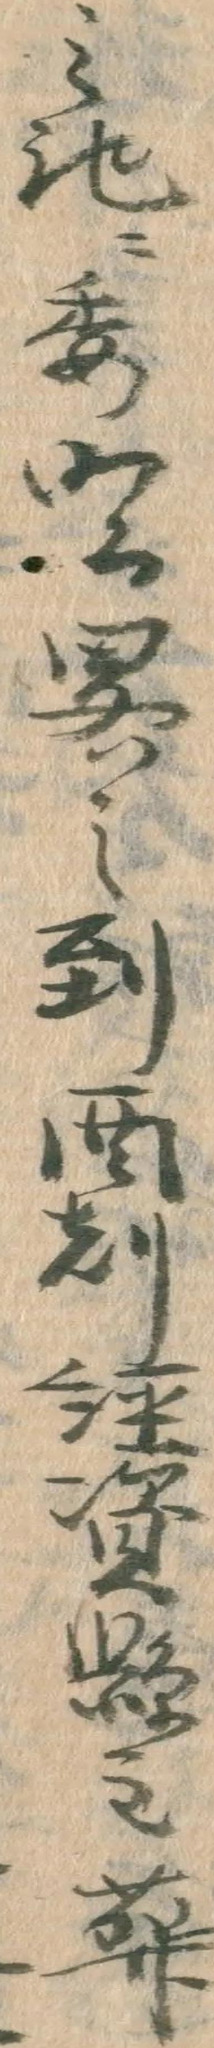之記二委時而略之、到酉刻経資縣主葬
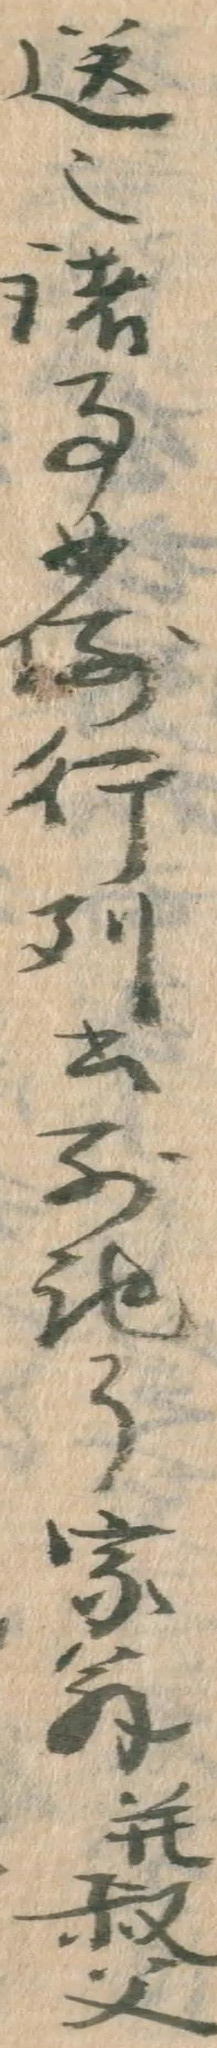送也、諸事如例行列書別記了、家翁并叔父
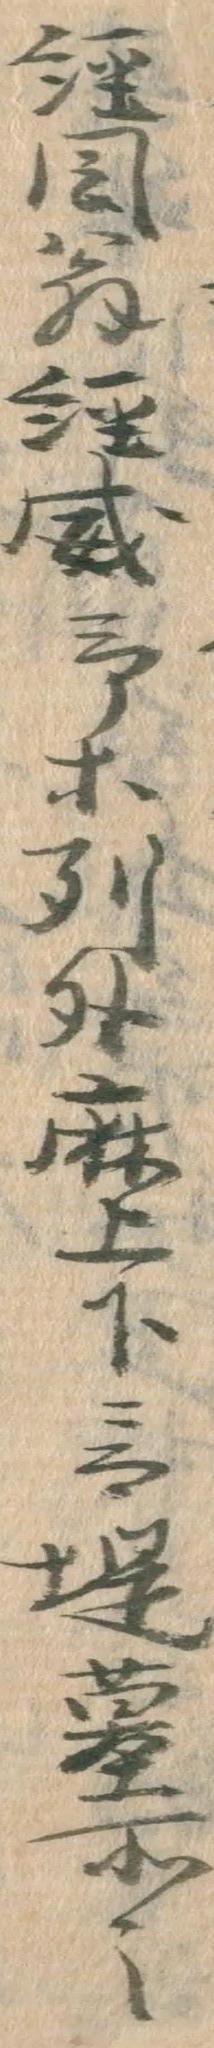経岡翁・経威・予等列外、麻上下ニ而堤墓所之
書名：賀茂社記録. 第63冊
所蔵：国立国会図書館 National Diet Library, JAPAN
